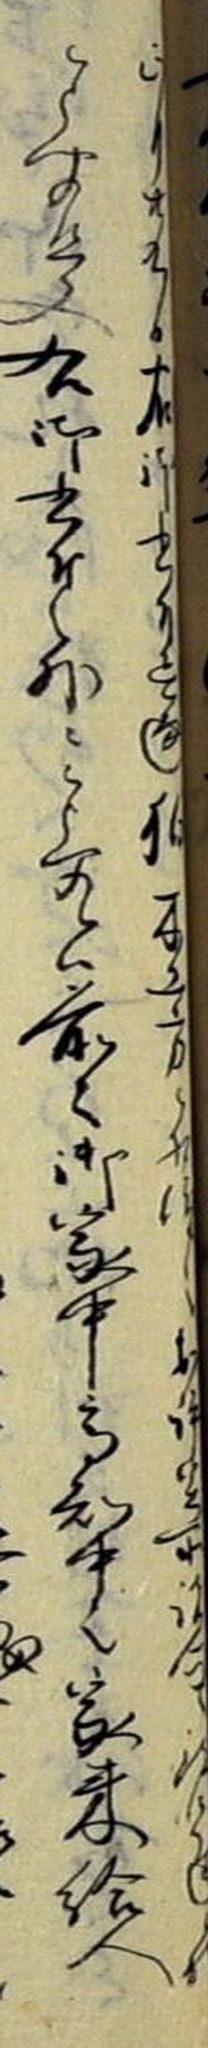被申聞且又右御書付之外に被申聞候は前々御家中高知中之家来給人
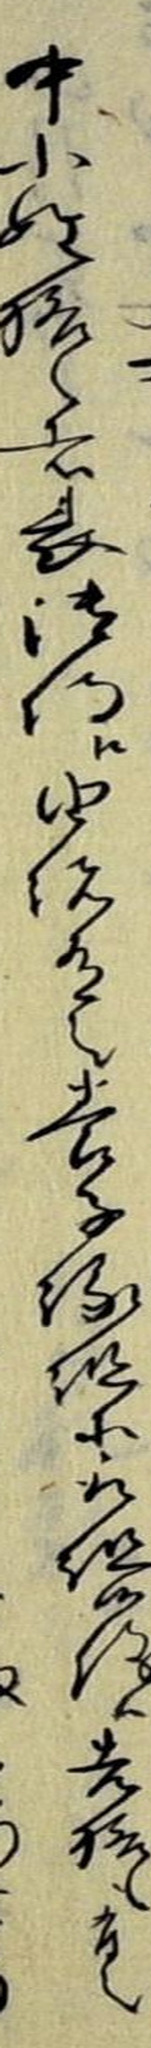中小姓格之者表御侍え由緒有之養子縁組等取組候儀は先格も有之
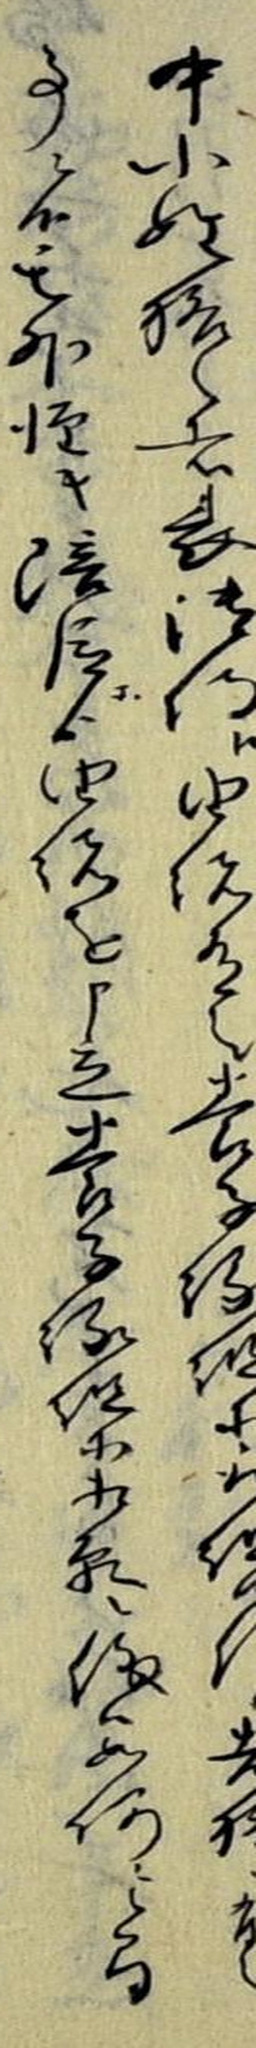事に候其外軽き陪臣等ゟ由緒を申立養子縁組等相願候儀は如何に候間
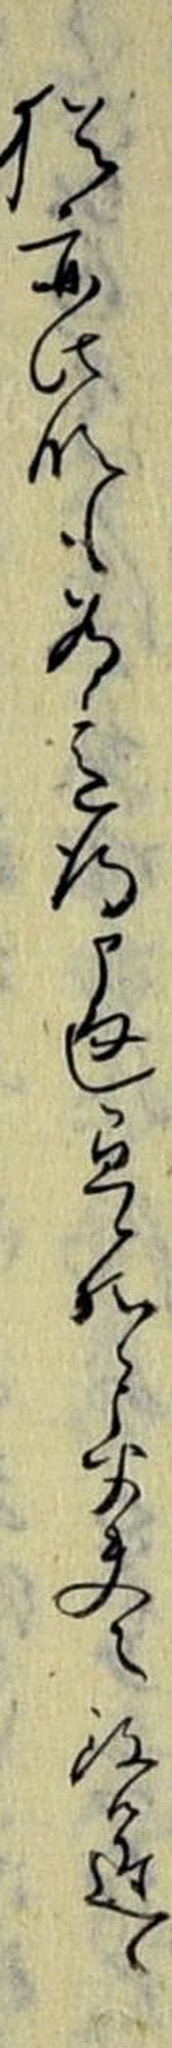猶亦此段も為意得申通置候様被申聞夫々致御達候
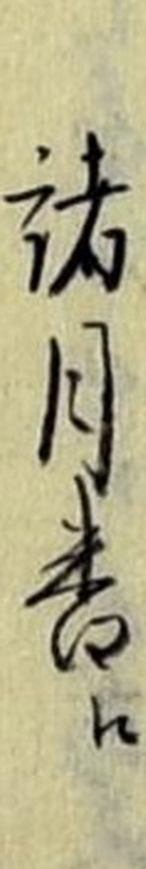諸月番江
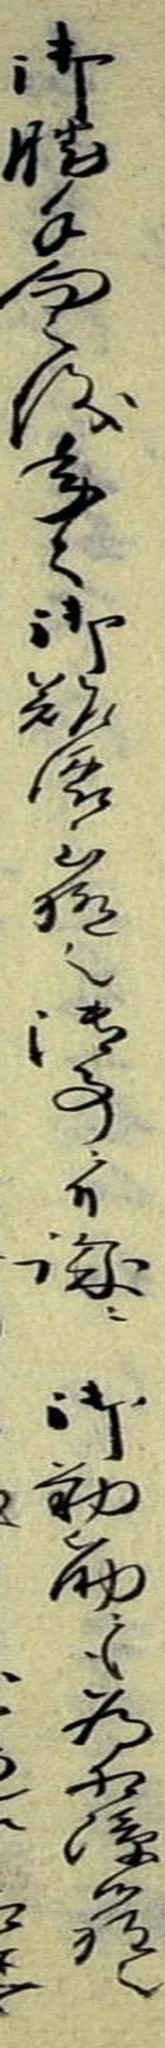〇御勝手向之儀年々御難渋至極之御事に付誠に御勤筋にも為相障候程之
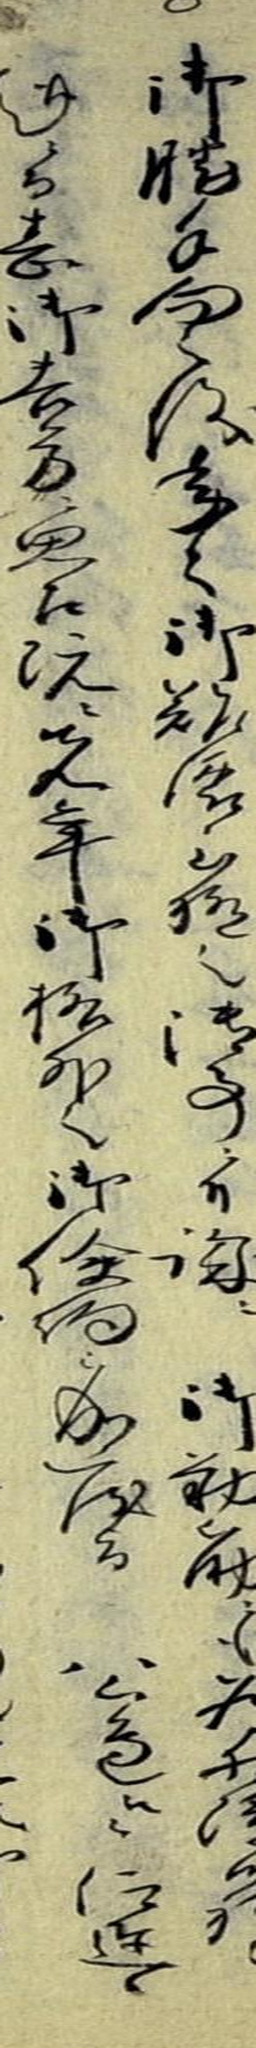趣に而甚御苦労に思召既に先年御格外之御倹約被成度旨公辺え被仰達候
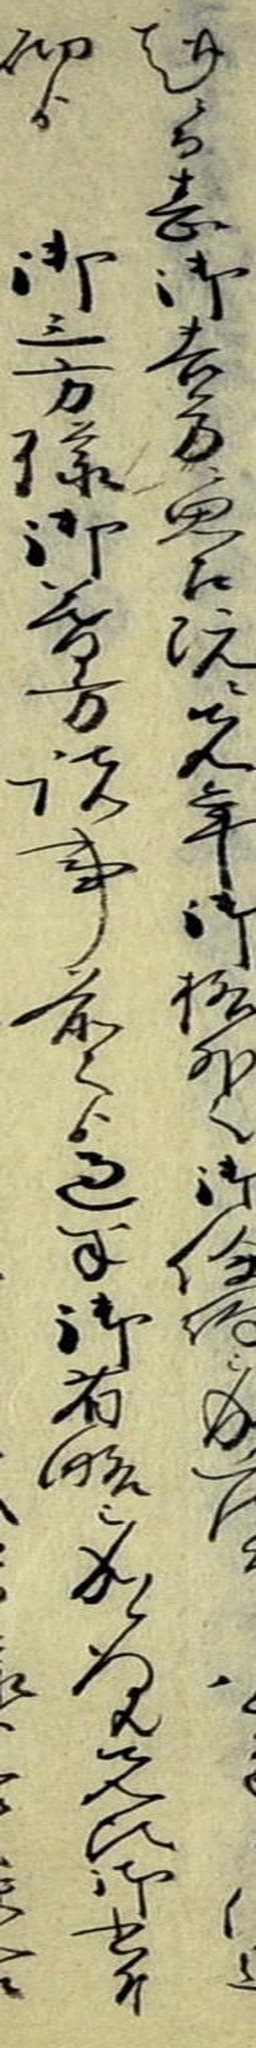砌ゟ御三方様御暮方諸事前々ゟ過半御省略被成候得共先頃御書付
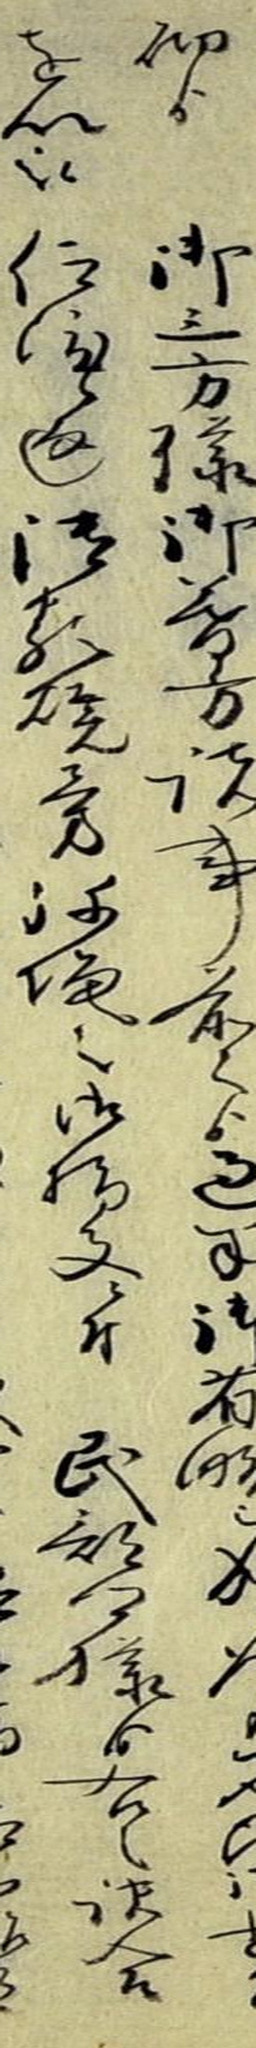を以被仰渡候通御類焼旁弥増之御指支に付民部卿様ゟ右之訳合
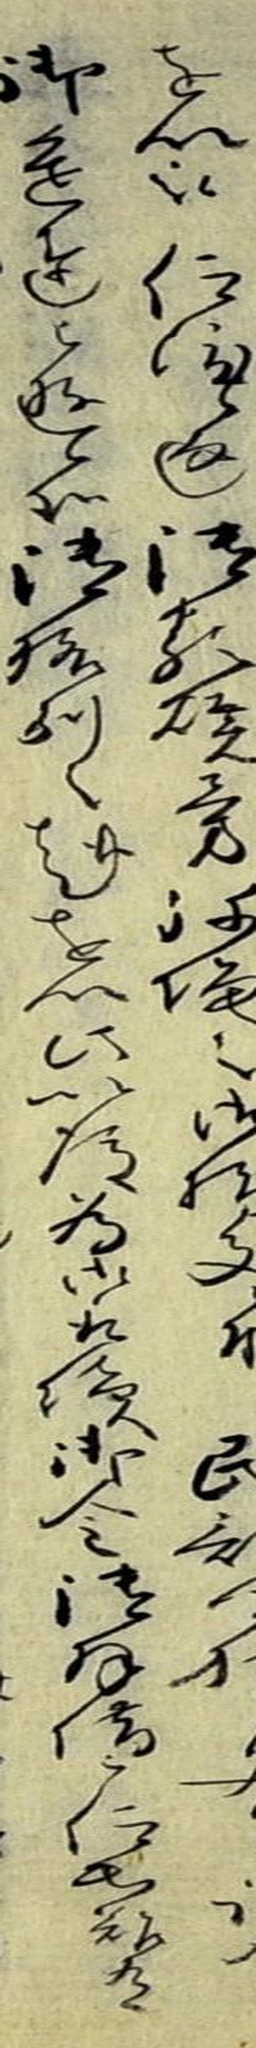御進達被遊候処御格別之趣を以此以後為御取続御金御拝借被仰出難有
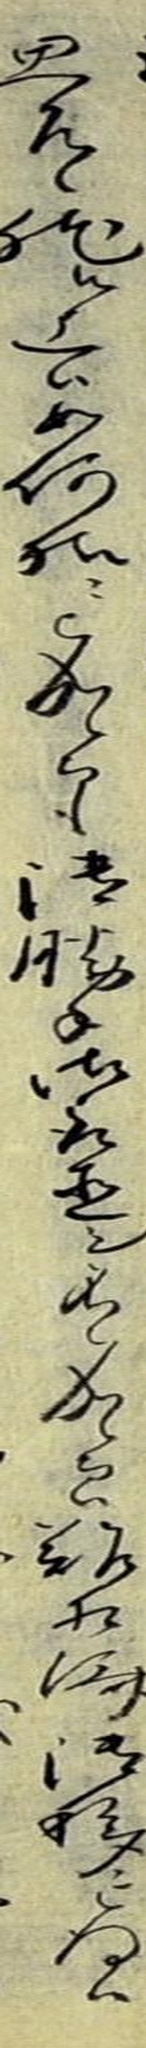思召候然る上は如何様に被成候而も御勝手御取直し不被成候而は難相済御移に候得は
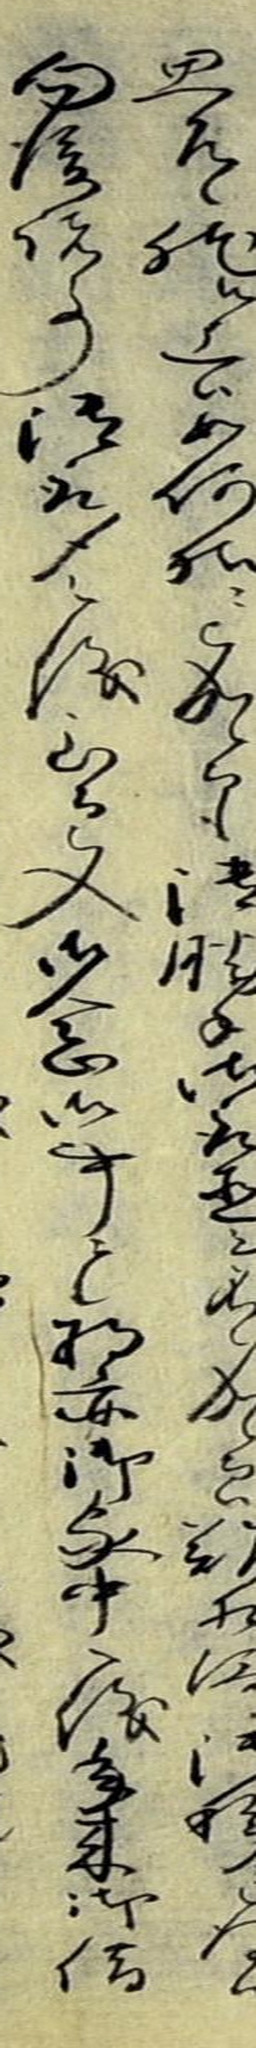向後諸事御取〆候儀至而被入御念御事に候将亦御家中之儀年来御借
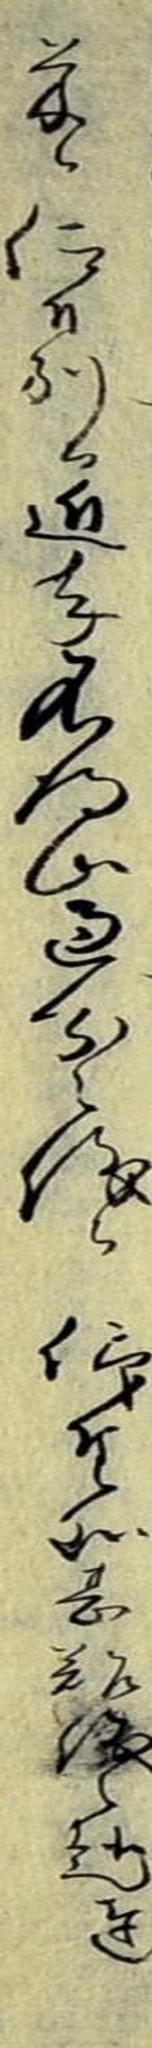米被仰付別而近年不得止過分之儀被仰付候処甚難儀之趣達
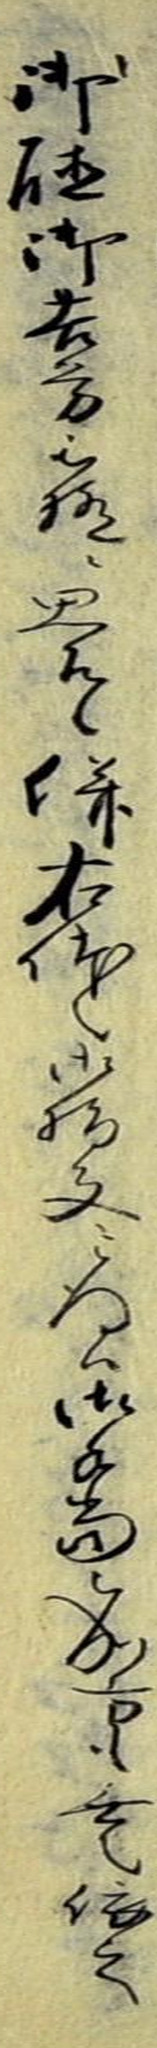御聴御苦労至極に思召候併右体之御指支に候得は御手当被成方も無之依之

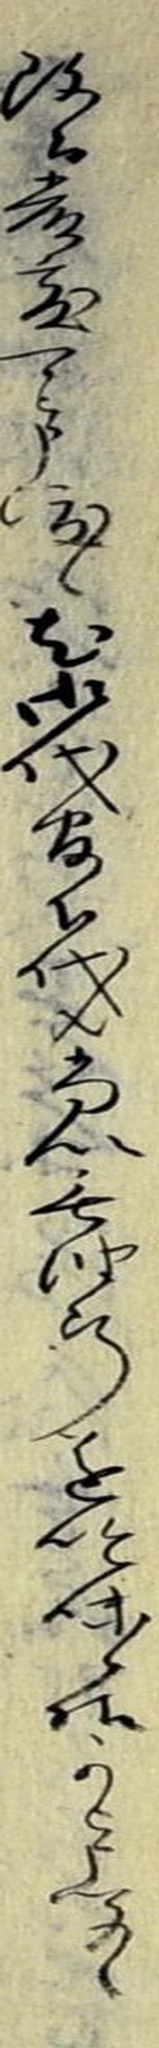改而厳敷可被申候尤御代官下代共尚以無油断遂吟味候様可被申聞候
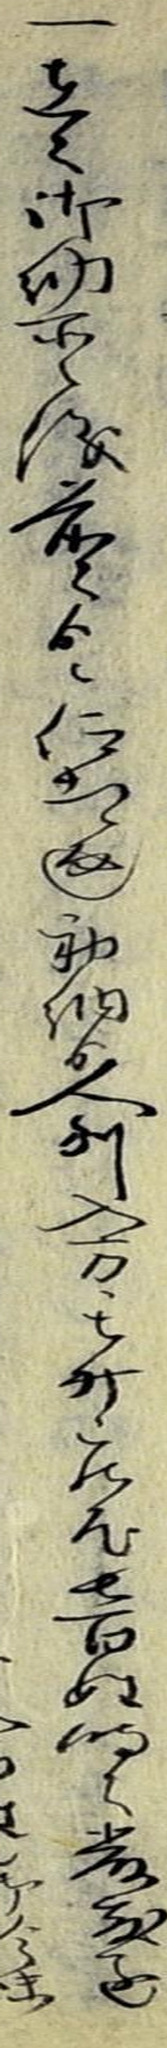一在々御納所之儀前々ゟ被仰出候通初納ゟ人別入方其村庄屋長百姓時々厳敷遂
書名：命令之部 二
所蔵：福井県文書館 Fukui Prefectural Archives
